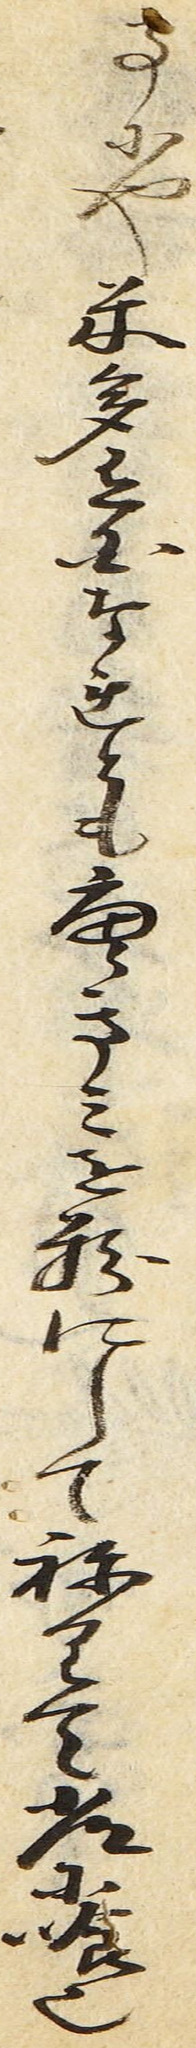事にや米多有国なれとも唐きみを粉にしてねりて常に喰也
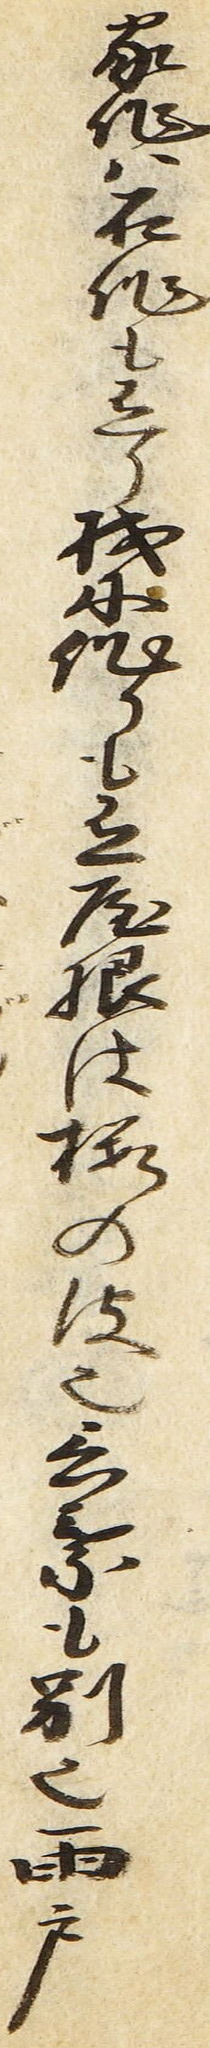家作は石作も有り材木作りも有屋根は桜の皮也言葉も別也雨戸
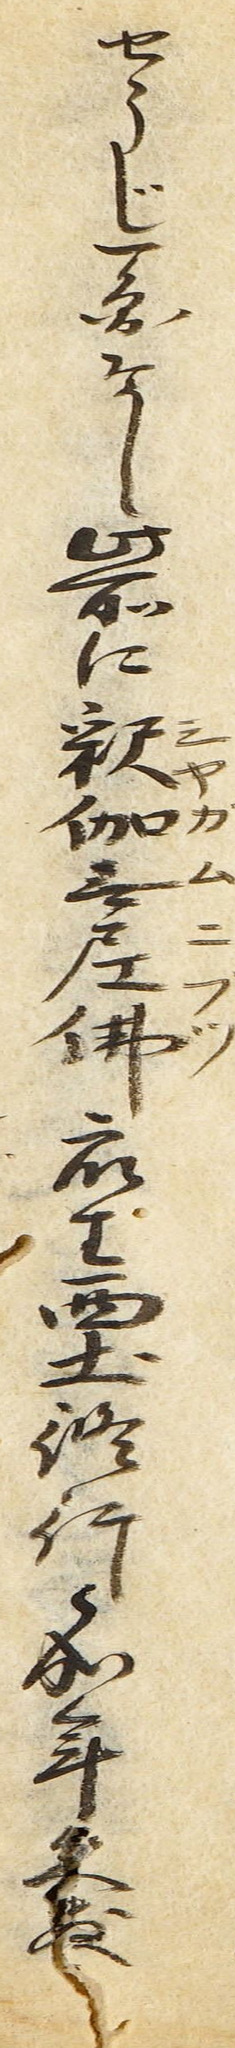せうじ一円なし此所に釈迦牟尼仏衆上西土修行候成年久敷
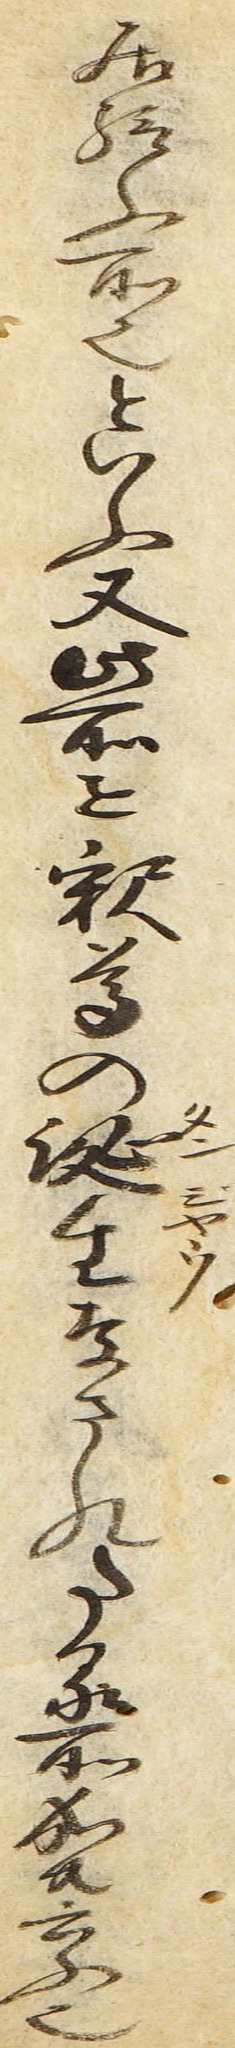居給ふ所也といふ又此所を釈尊の誕生なされたる所成共云ふ也

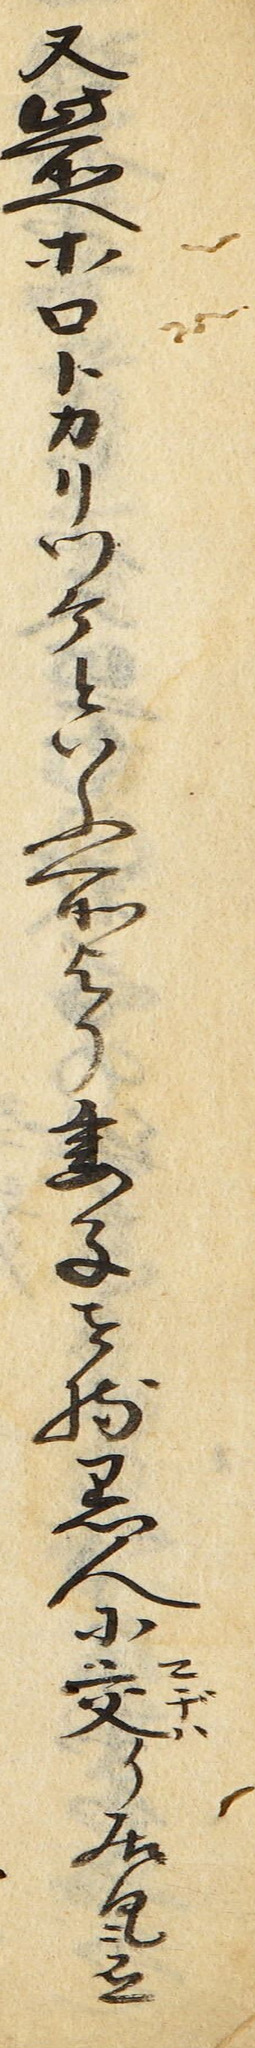又此所へホロトカリツケといふ所より妻子を持黒人に交り居るも有
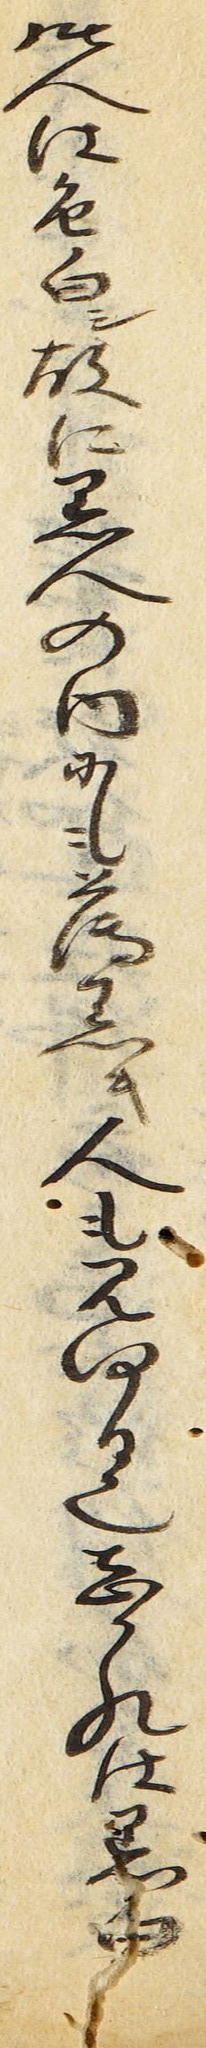此人は色白し故に黒人の内にも薄黒き人も見ゆる也しかれは黒白
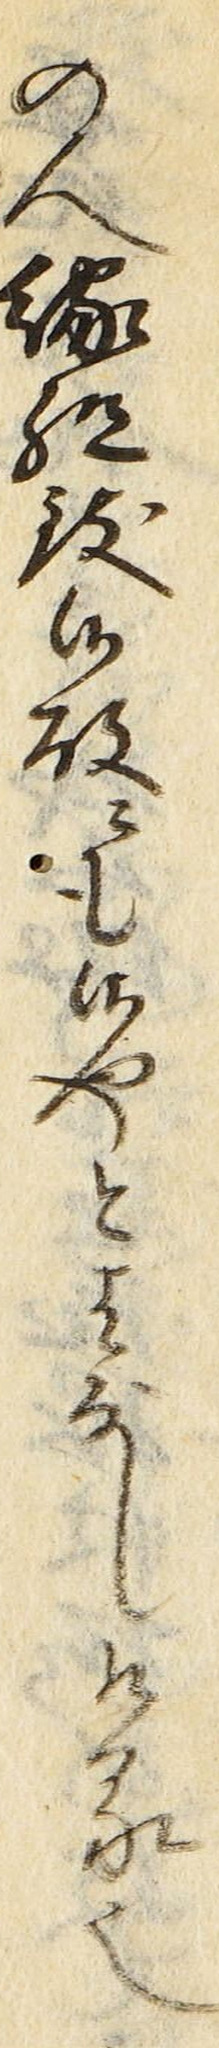の人縁組致候故にも候やとはなしける也
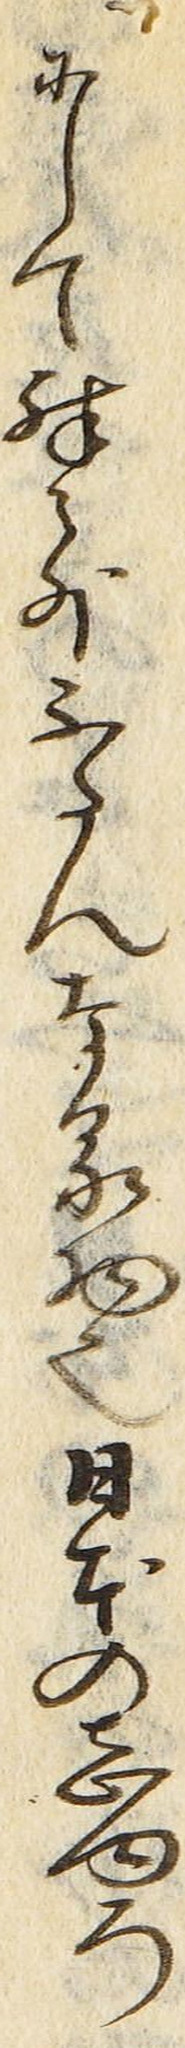にして殊之外ふたんなる物也日本のしゆろ
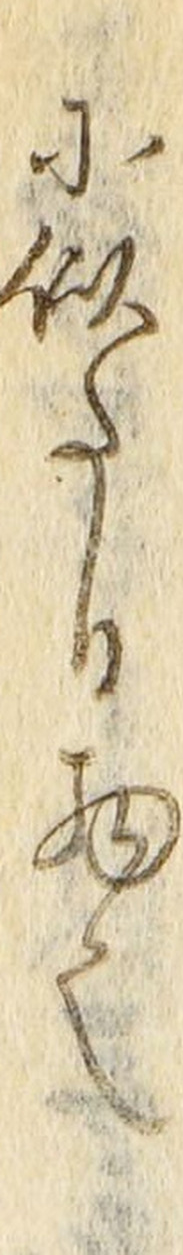に似たる物也
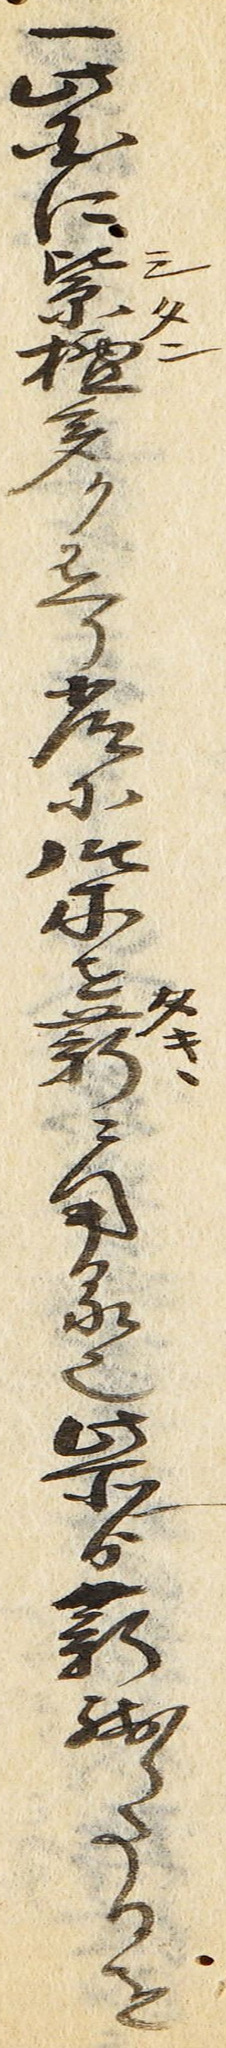一此国に紫檀多く有り常に此木を薪に用る也此所ゟ薪残りたるを
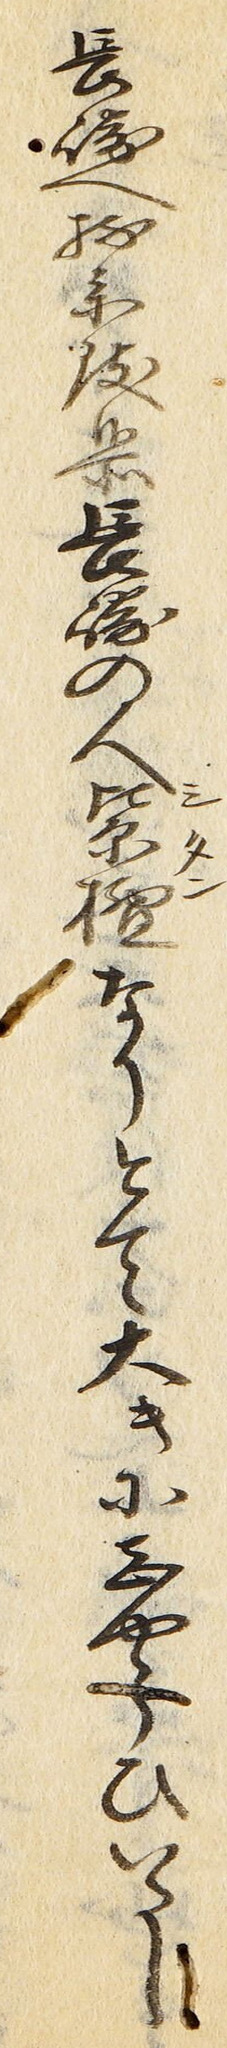長崎へ持参致候所長崎の人紫檀なりとて大きにしやらひいたし
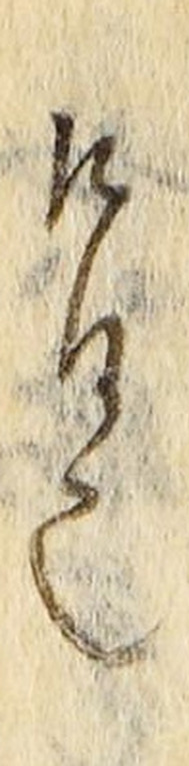ける也
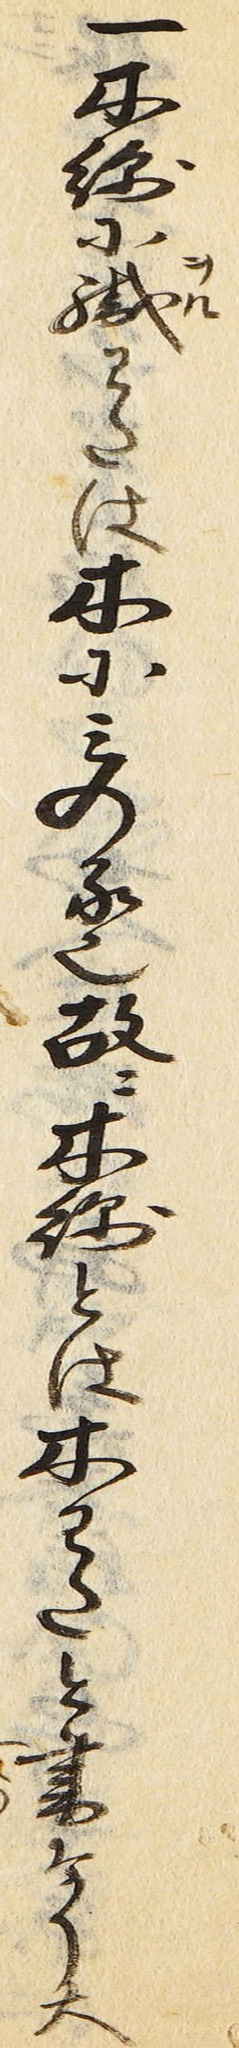一木綿に織わたは木にみのる也故に木綿とは木わたと書なり大
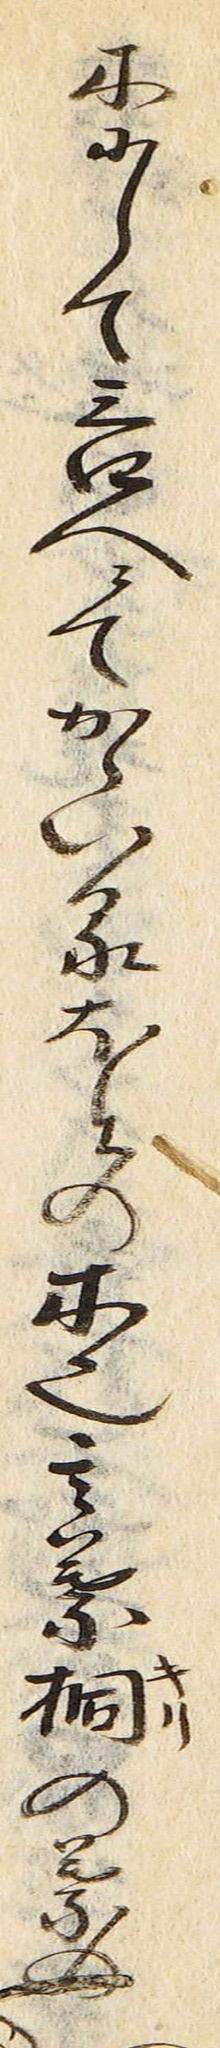木にして三四人にてからいるほとの木也其葉桐の葉の
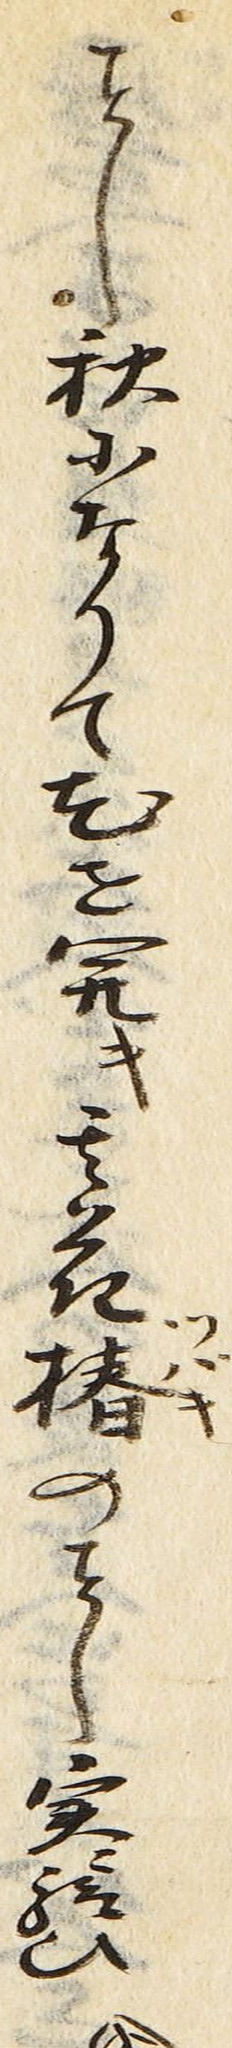ことし秋になりて花を開き其花椿のことし実に結ひ
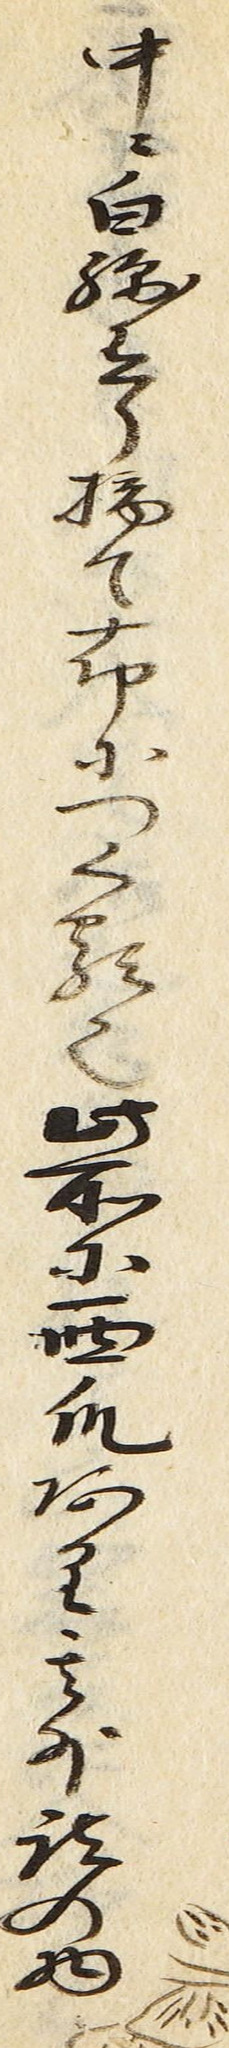中に白綿有り摘みて布につくる也此所に西瓜あり其外諸の物
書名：外国漂流記
